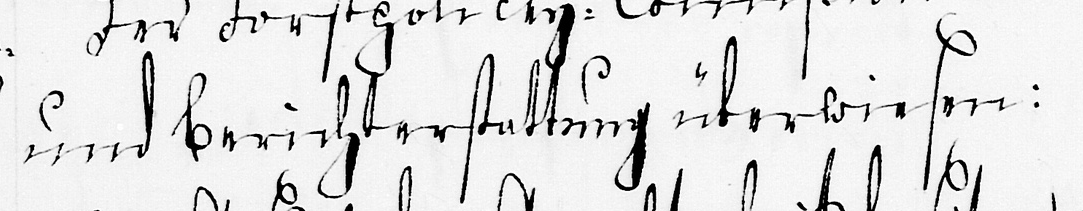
und Berichterstattung überwiesen:
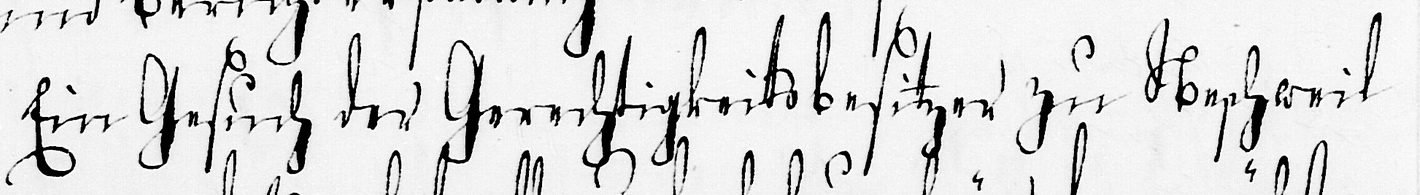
Ein Gesuch der Gerechtigkeitsbesitzer zur Neschweil
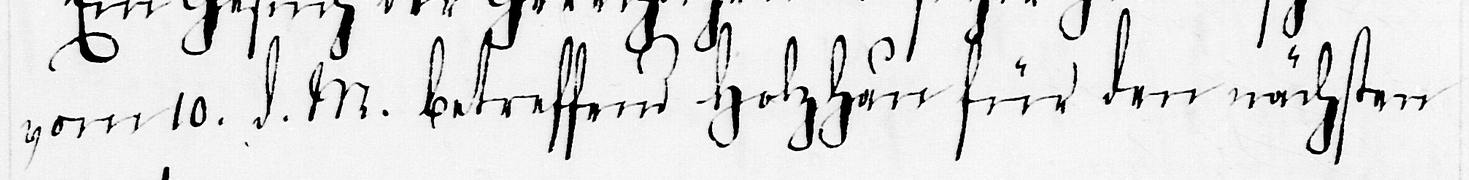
vom 10. d. M. betreffend Holzhau für den nächsten
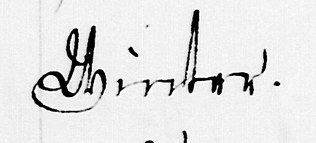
Winter.
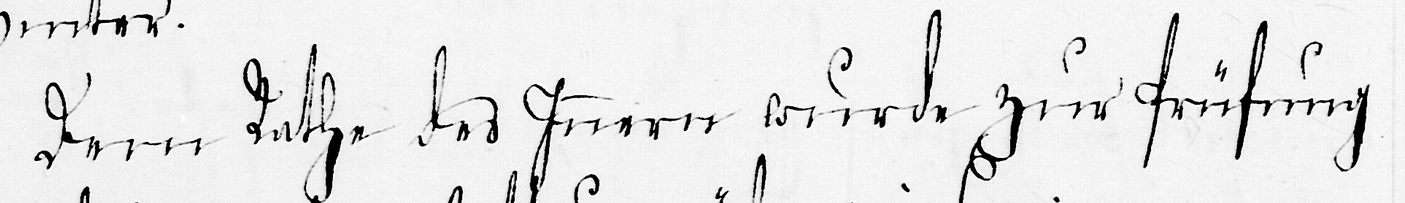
Dem Rathe des Innern wurde zur Prüfung
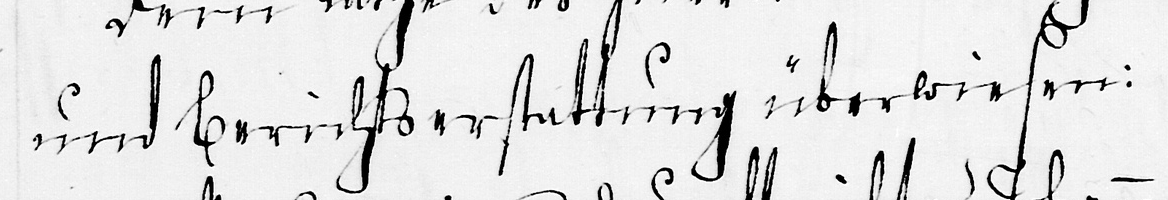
und Berichtserstattung überwiesen:
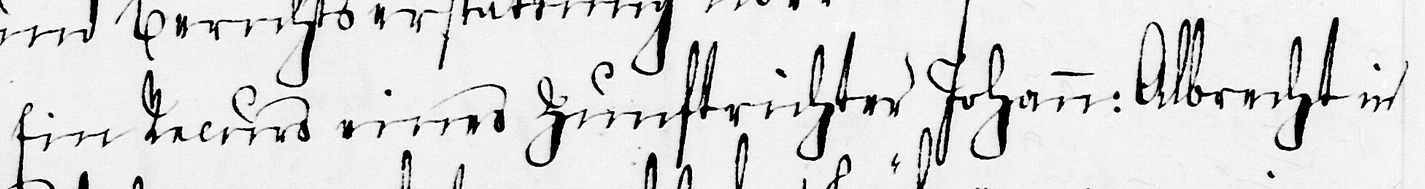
Ein Recurs eines Zunftrichter Johann: Albrecht in
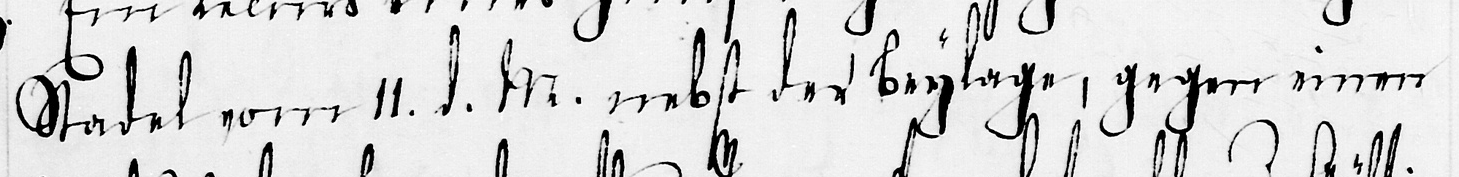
Stadel vom 11. d. M. nebst der Beylage, gegen einen
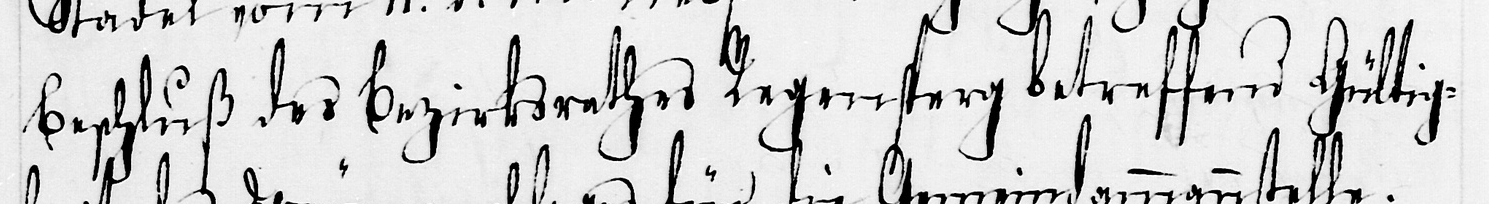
Beschluß des Bezirksrathes Regensperg betreffend Gültig¬
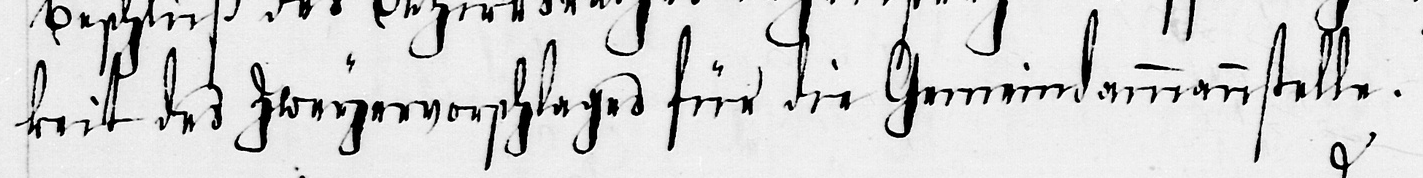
keit des Zweyervorschlages für die Gemeindammannstelle.
